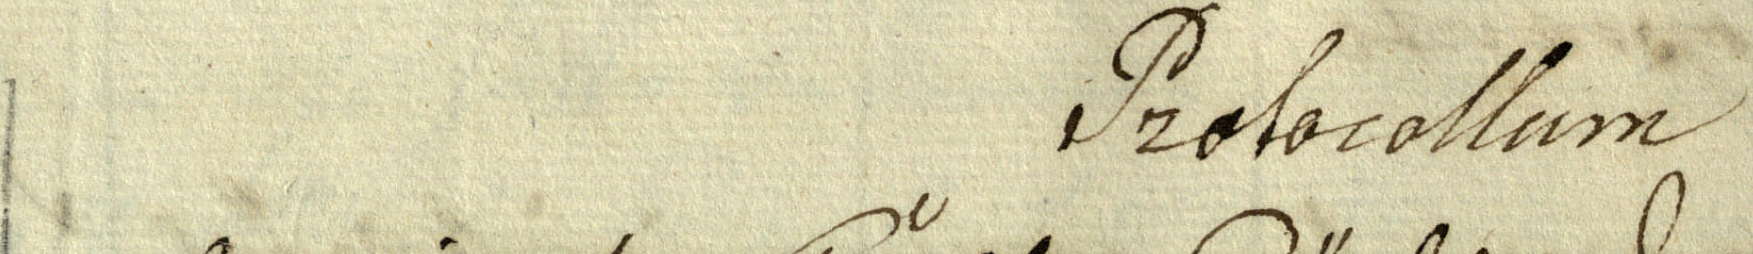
Protocollum
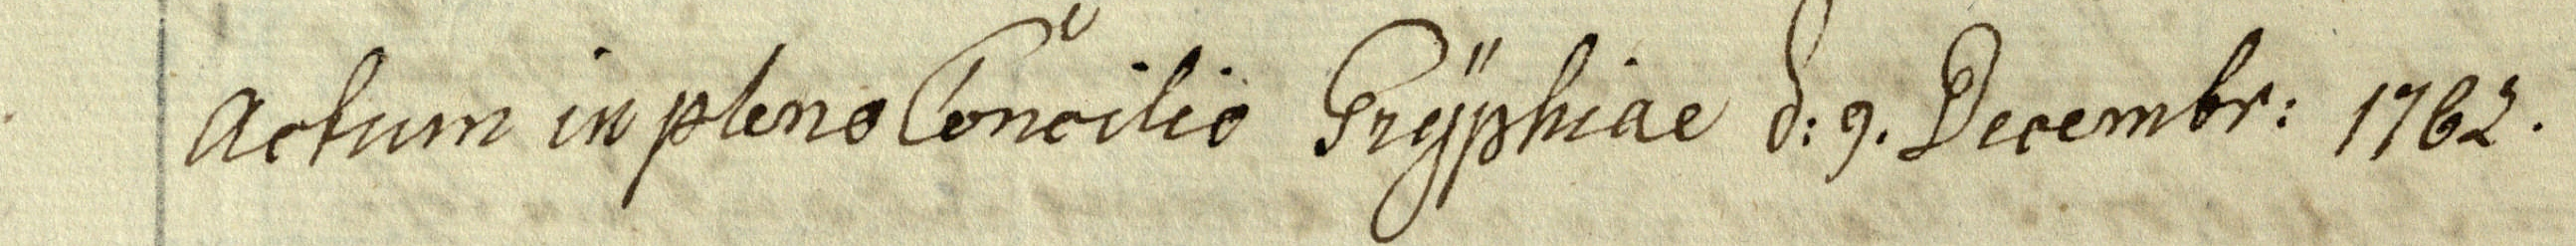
Actum in pleno Concilio Grÿphiae d. 9. Decembr. 1782.
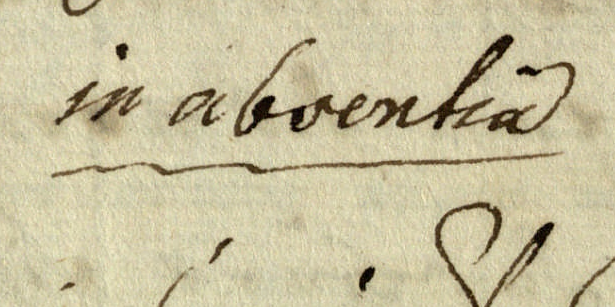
in absentia
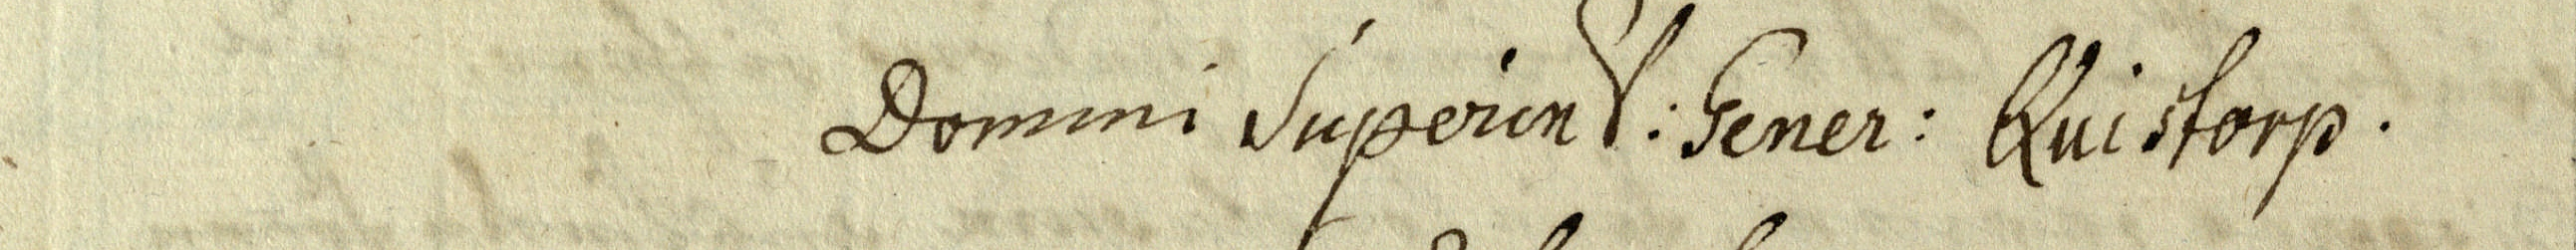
Domini Superint. Gener. Quistorp.
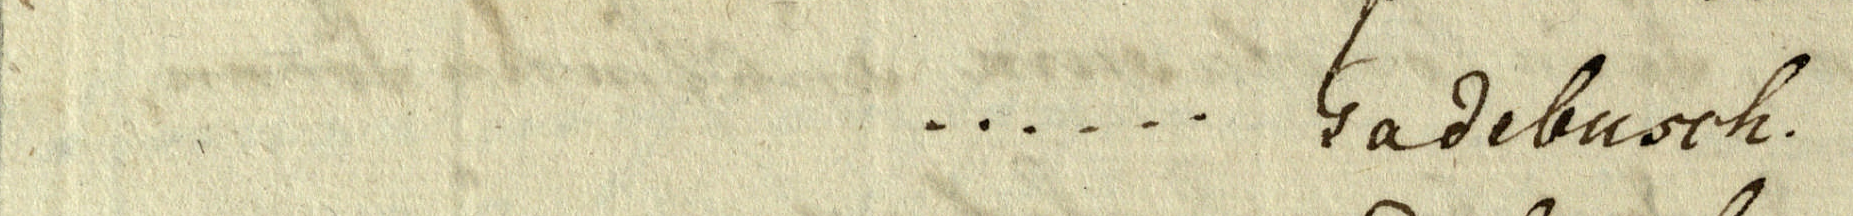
Gadebusch.
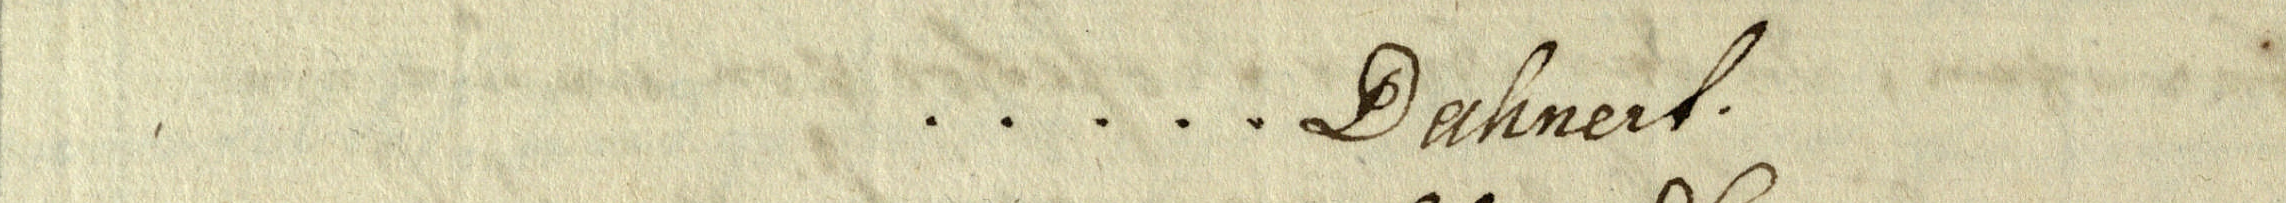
Dähnert.
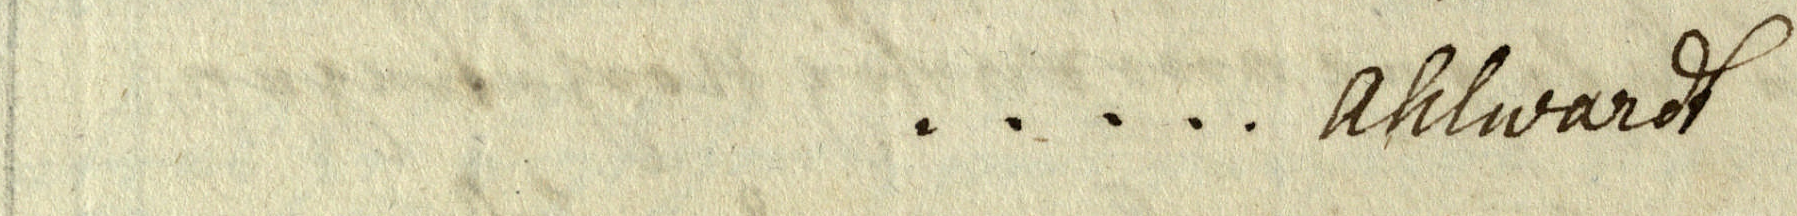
Ahlwardt
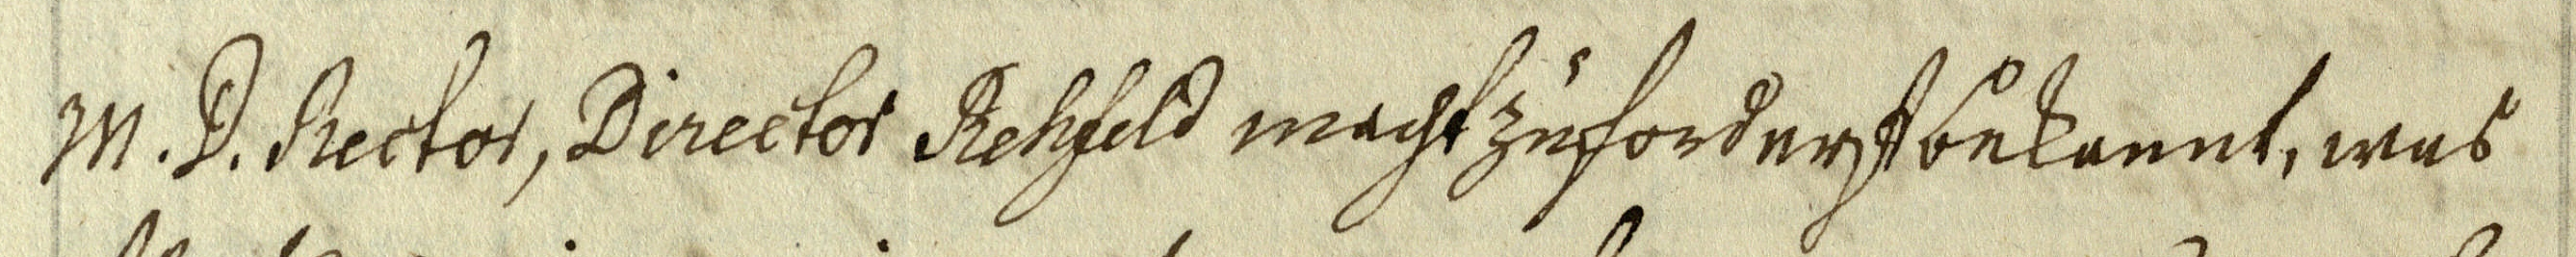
M. D. Rector, Director Rehfeld macht zuforderst bekannt, was
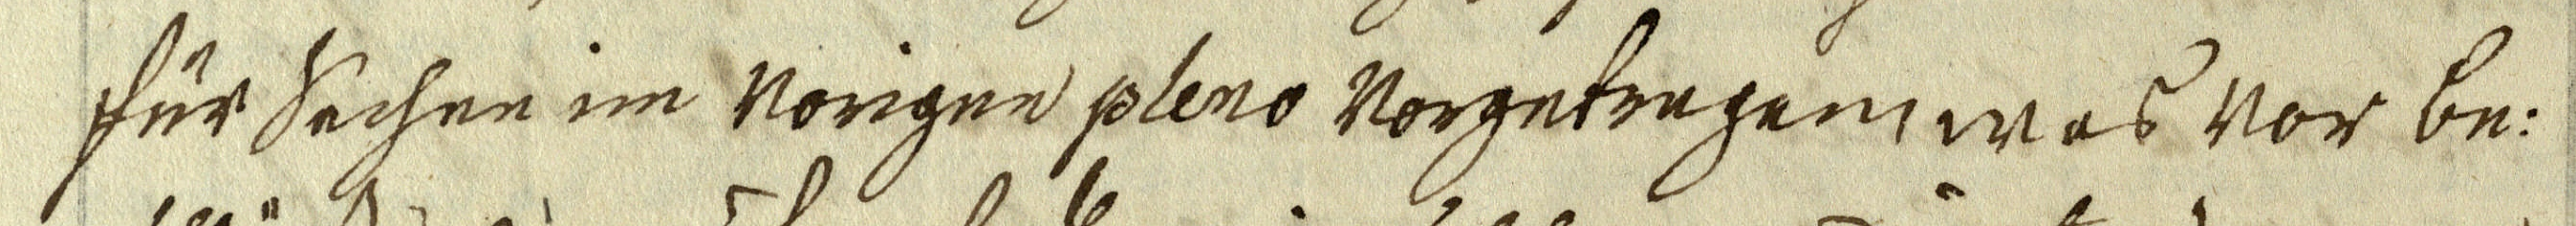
für Sachen im vorigen pleno vorgetragen, was vor Be¬
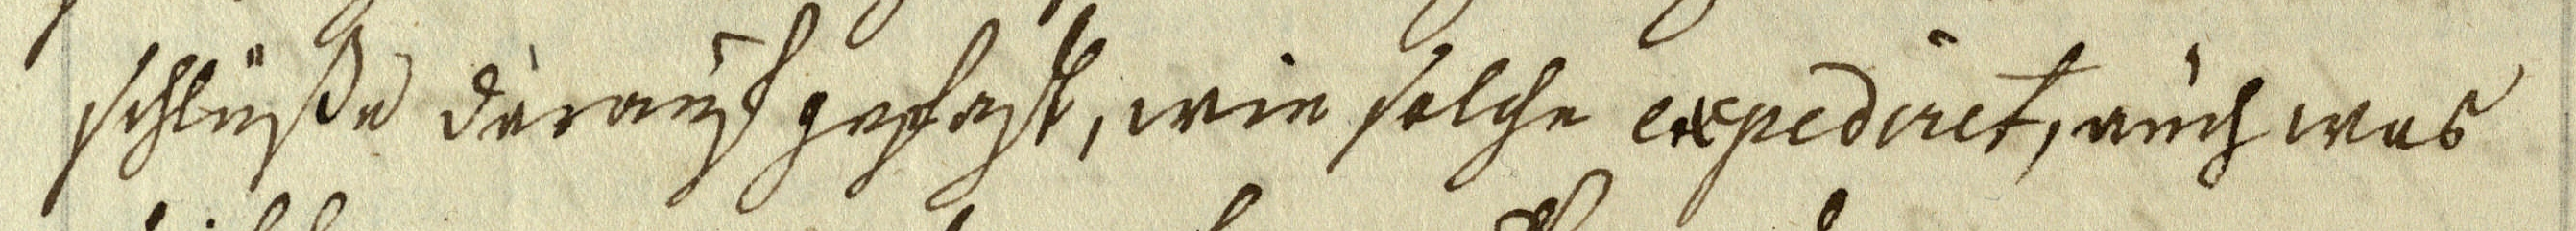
schlüße darauf gefast, wie solche expediret, auch was
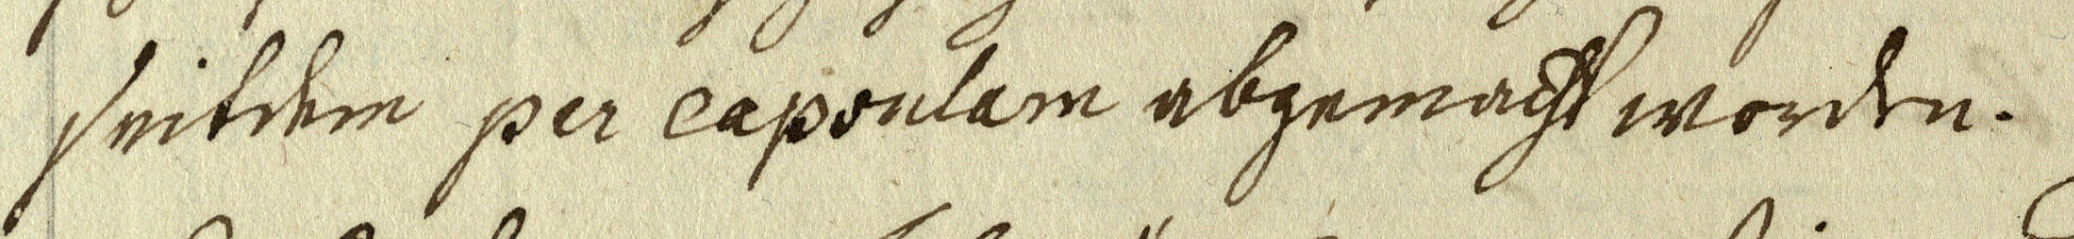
seitdem per capsulam abgemacht worden.
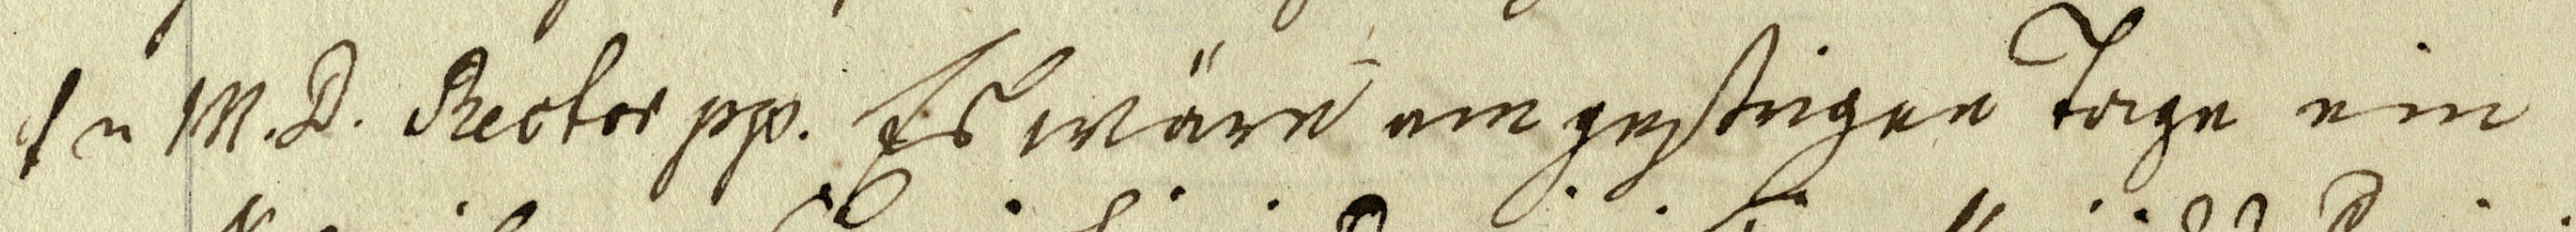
1. M. D. Rector pp. Es wäre am gestrigen Tage ein
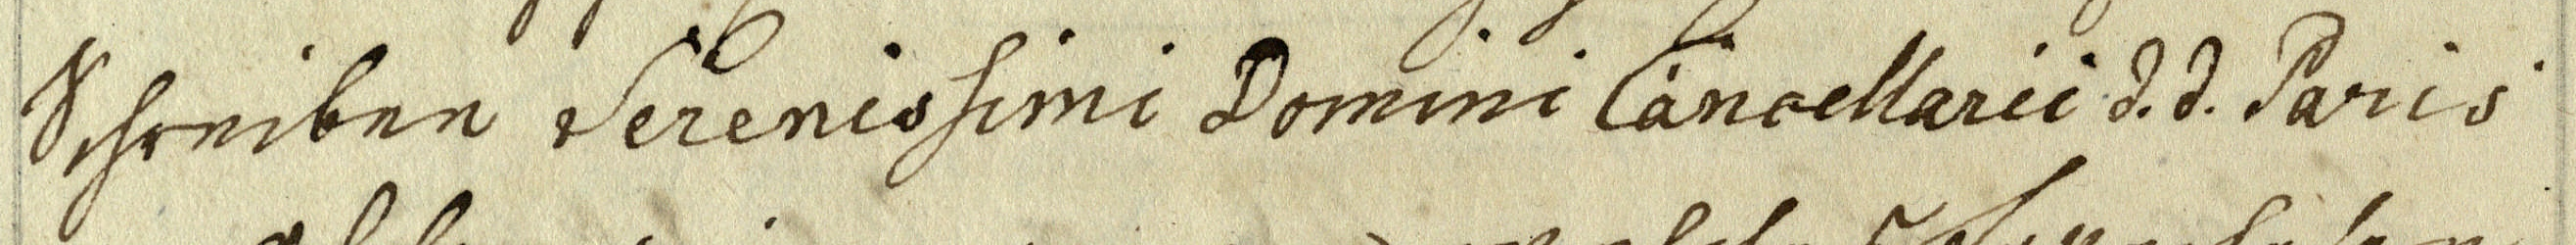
Schreiben Serenissimi Domini Cancellarii d. d. Paris
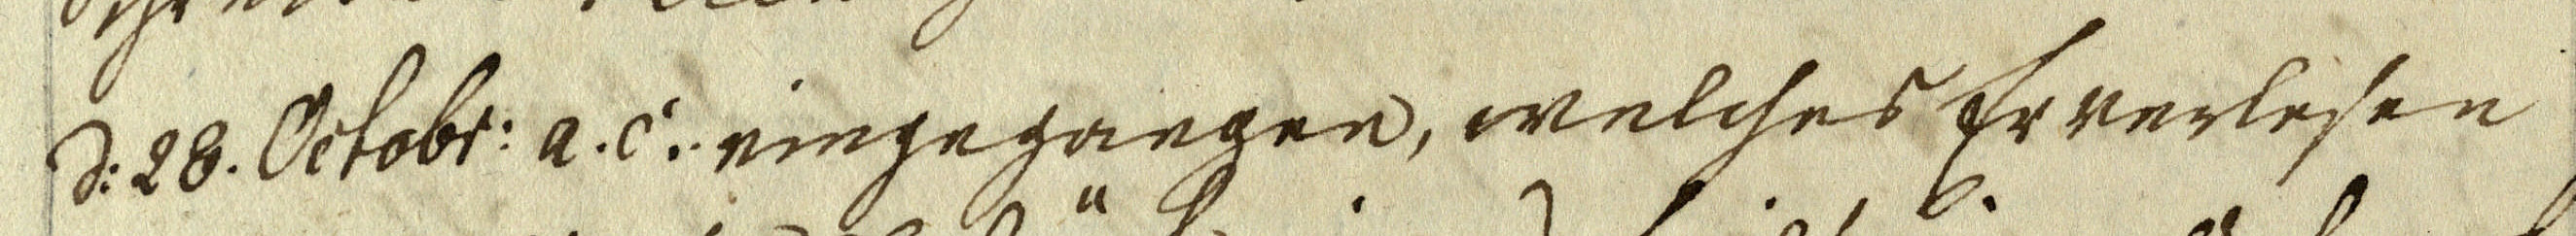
d. 28. Octobr. a. c. eingegangen, welches Er verlesen
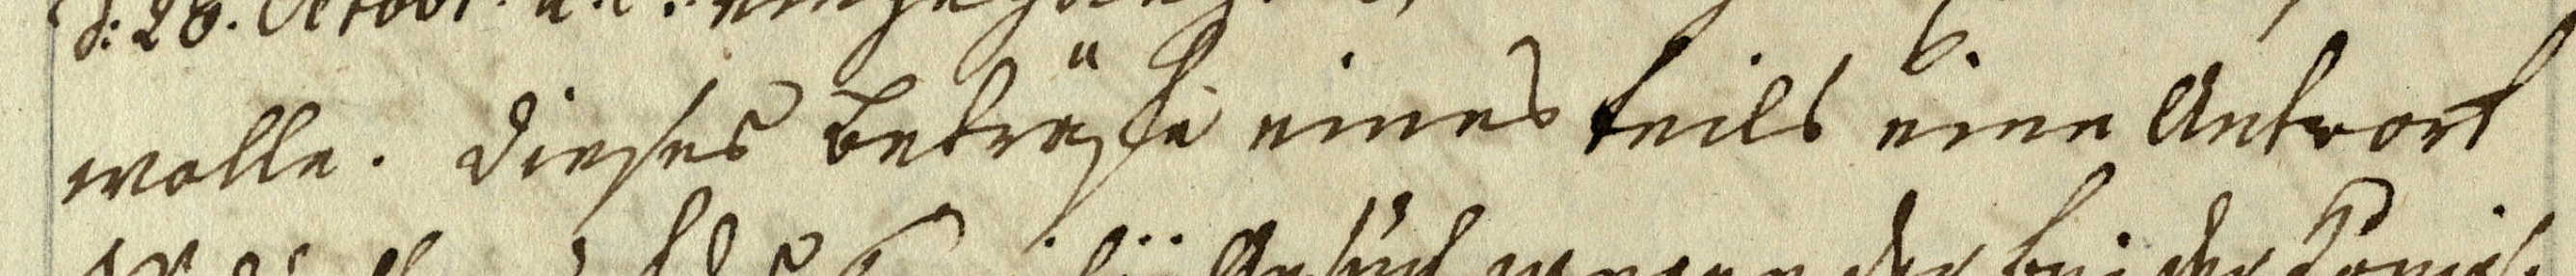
wolle. Dieses beträfe eines theils eine Antwort
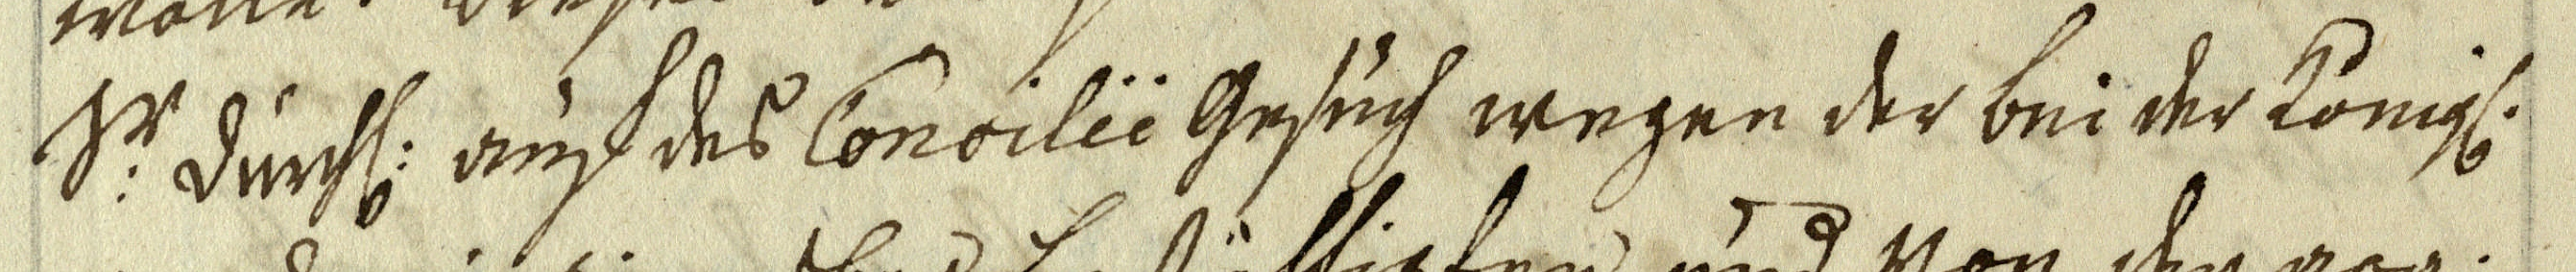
Sr. Durchl. auf des Concilii Gesuch wegen der bei der Königl.
